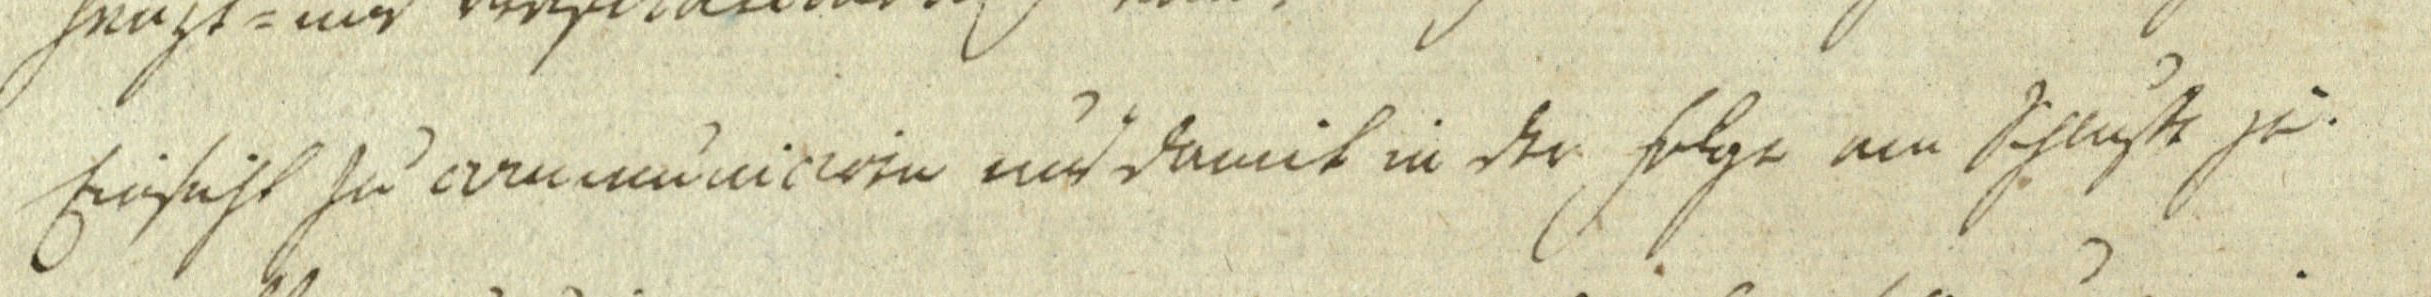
Einsicht zu communiciren und damit in der Folge am Schlusse je¬
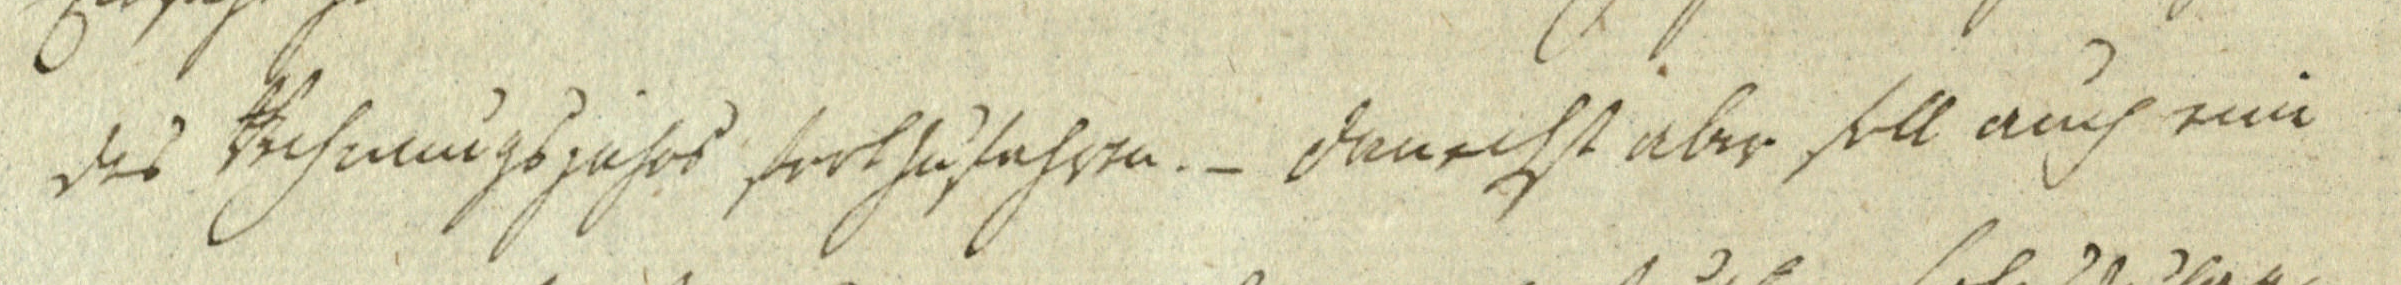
des Rechnungsjahrs fortzufahren. Danechst aber soll auch eine
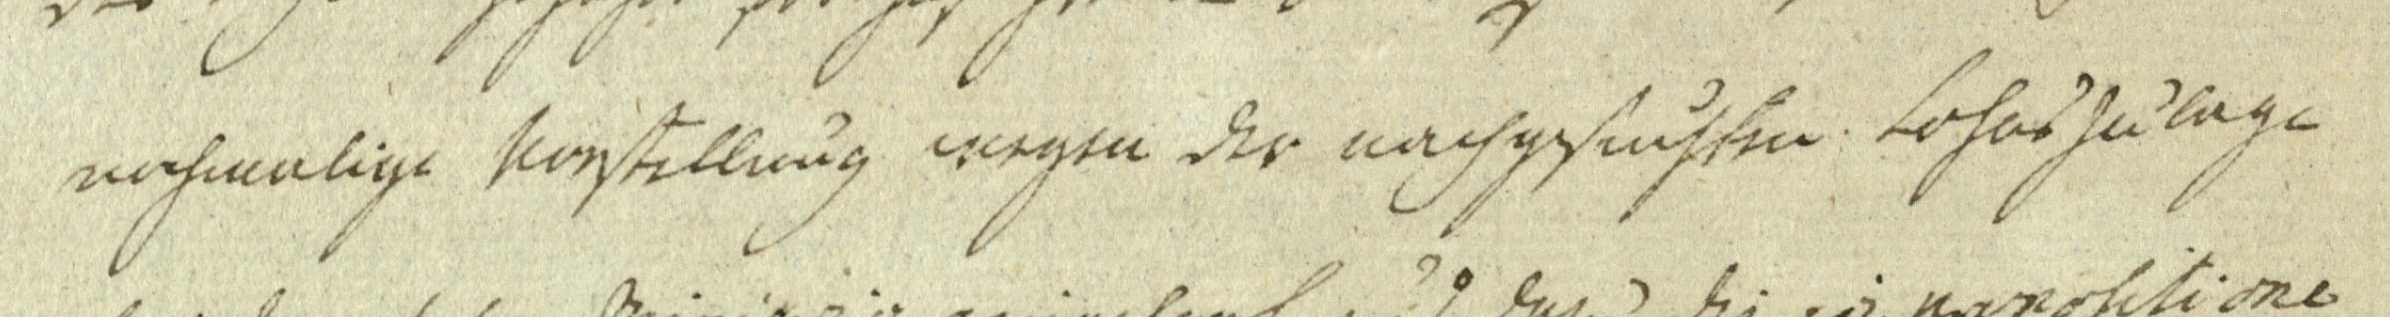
nochmalige Vorstellung wegen der nachgesuchten Lohnszulage
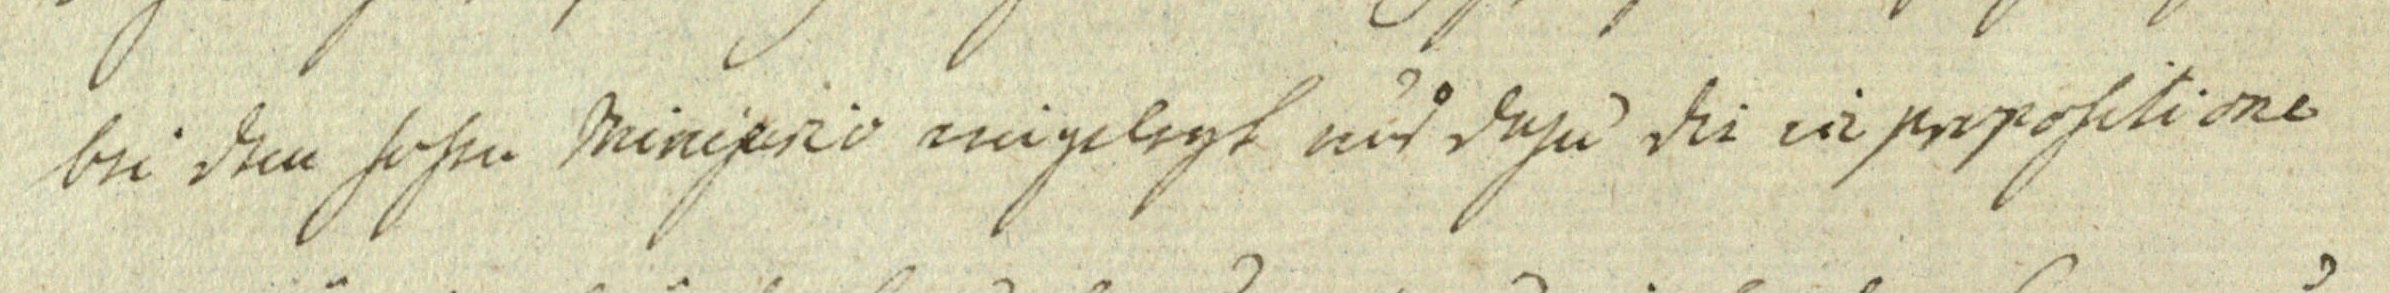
bei dem hohen Ministerio eingelegt und dazu die in propositione
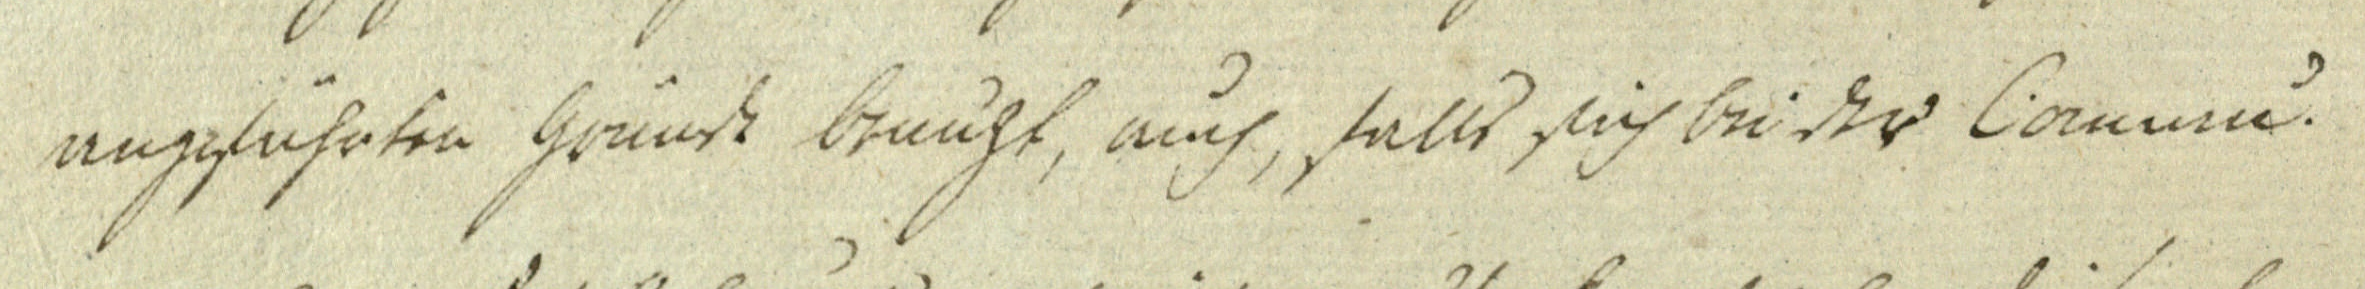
angeführten Gründe benuzt, auch, falls sich bei der Commu¬
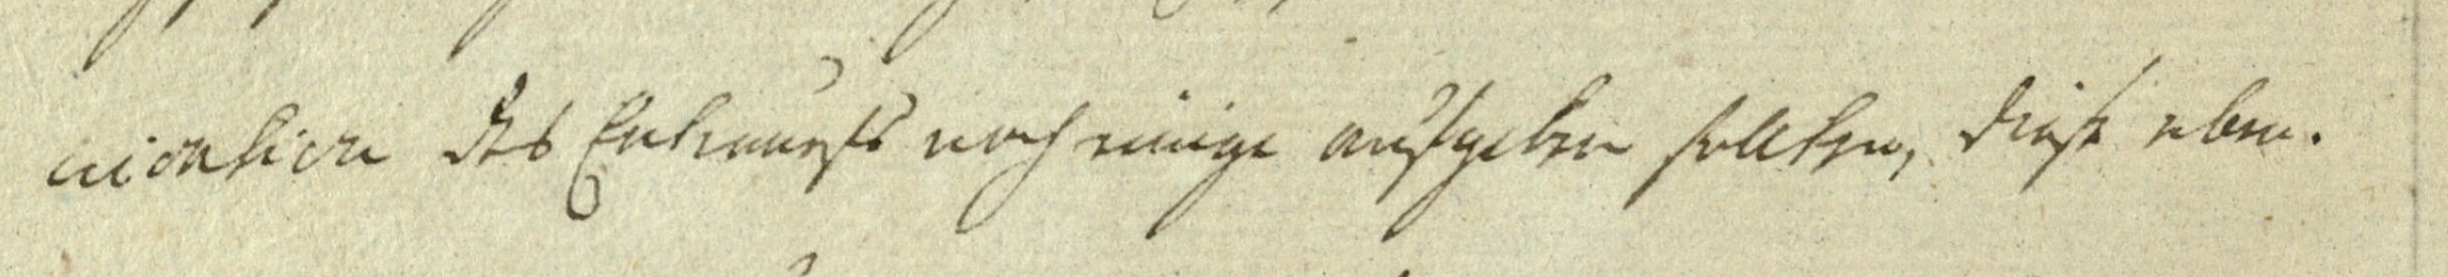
nication des Entwurfs noch einige aufgeben sollten, diese eben¬
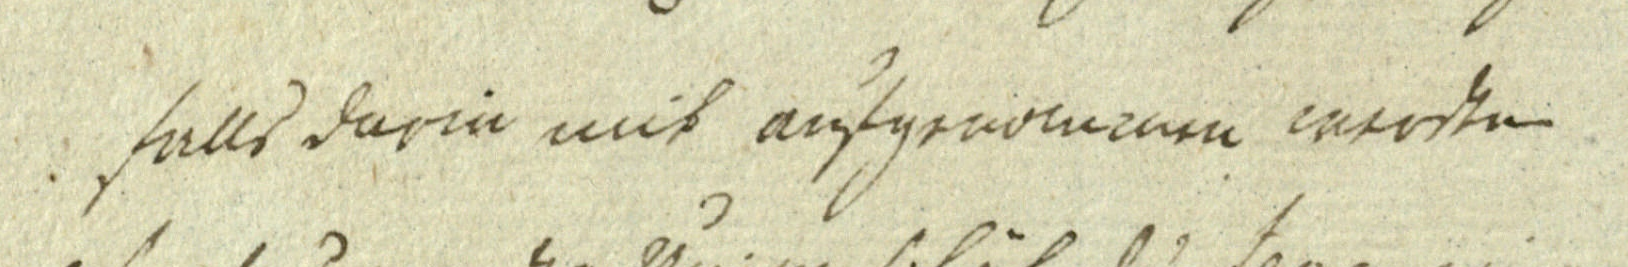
falls darin mit aufgenommen werden.
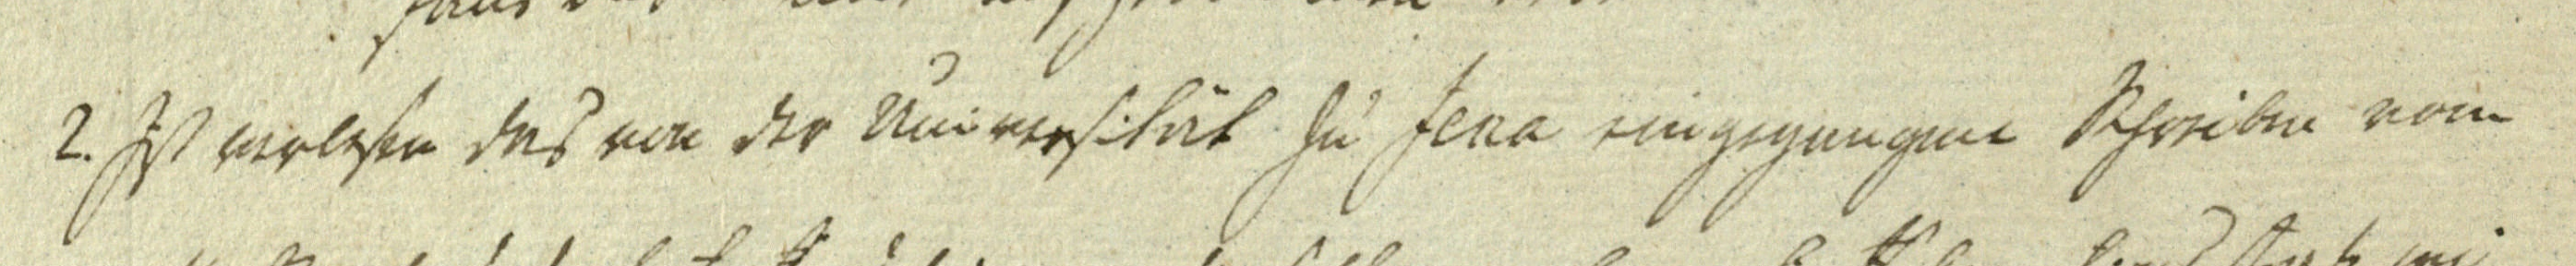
2. Ist verlesen das von der Universität zu Jena eingegangene Schreiben vom
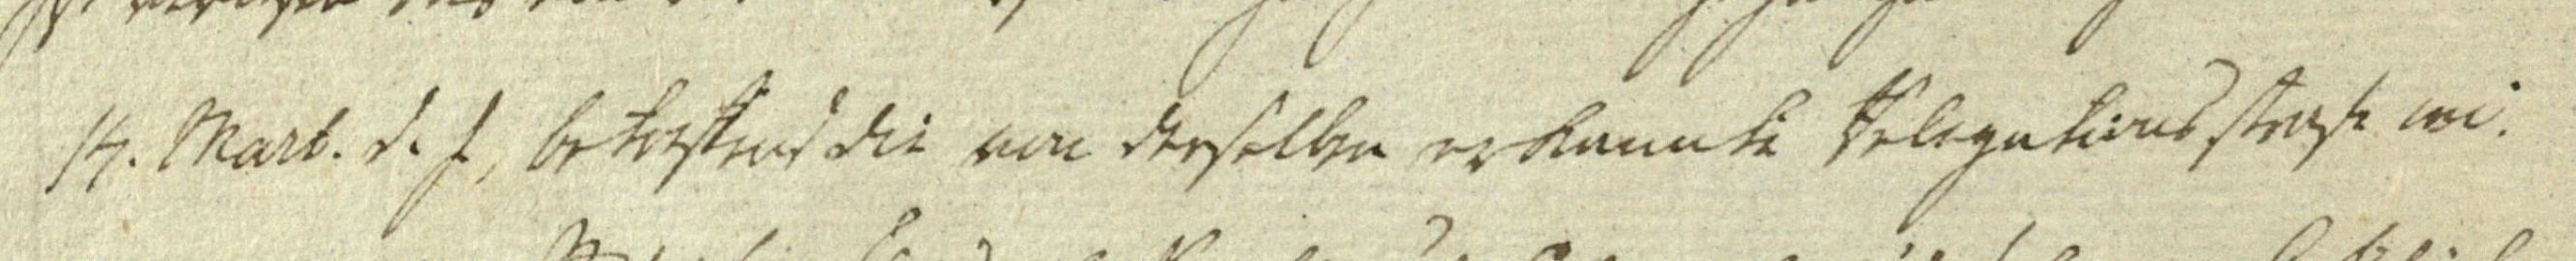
14. Mart. d. J. betreffend die von derselben erkannte Relegationsstrafe wi¬
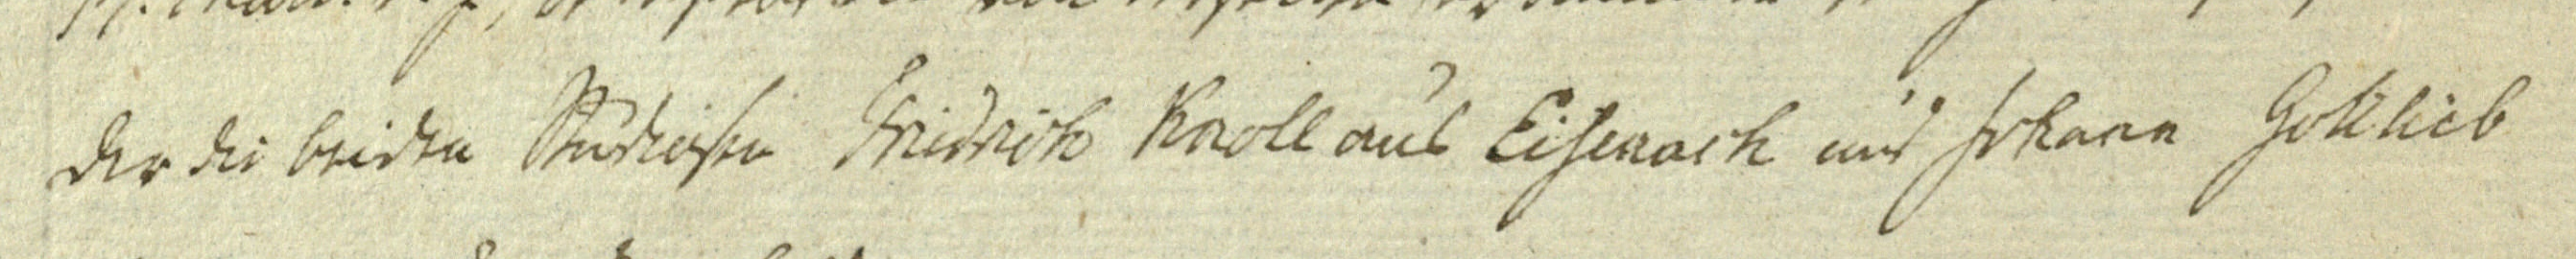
der die beiden Studiosen Friedrich Knoll aus Eisenach und Johann Gottlieb
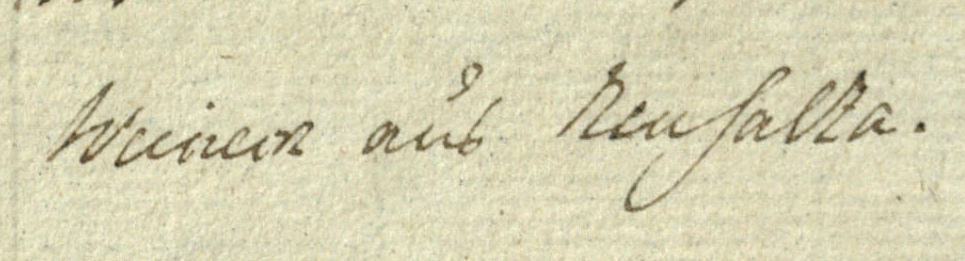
Weineck aus Neusalza.
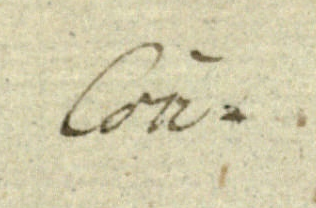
Con¬
